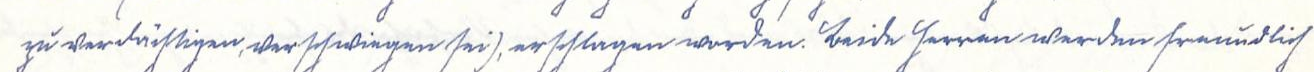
zu verdächtigen, verschwiegen sei), erschlagen worden. Beide Herren werden freundlich
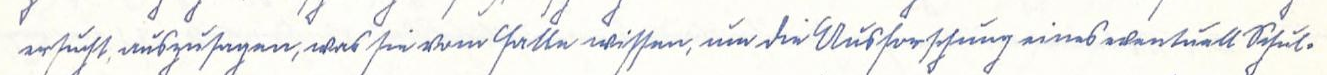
ersucht, auszusagen, was sie vom Falle wissen, um die aus Ausforschung eines eventuell Schul-
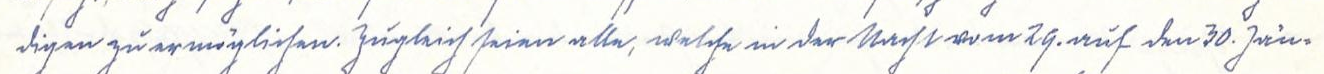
digen zu ermöglichen. Zugleich seien alle, welche in der Nacht vom 29. auf den 30. Jän-
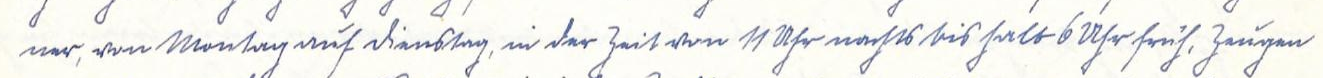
ner, von Montag auf Dienstag, in der Zeit von 11 Uhr nachts bis halb 6 Uhr früh, Zeugen
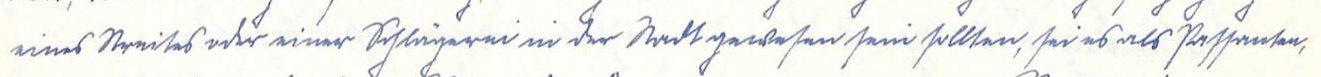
eines Streites oder einer Schlägerei in der Stadt gewesen sein sollten, sei es als Passanten,
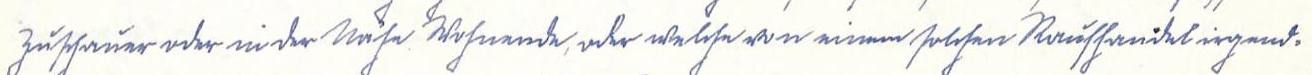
Zuschauer oder in der Nähe wohnender, oder welche von einem solchen Raufhandel irgend
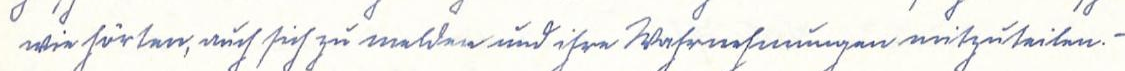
wie hörten, auch sich zu melden und ihre Wahrnehmungen mitzuteilen.-
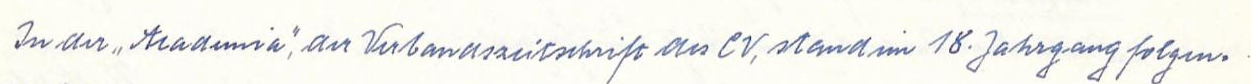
In der „Akademia“ , der Verbandszeitschrift des CV, stand im 18. Jahrgang folgen-
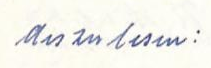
des zu lesen:
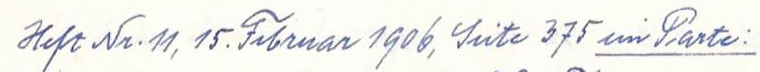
Heft Nr. 11, 15. Februar 1906, Seite 375 eine Parte:
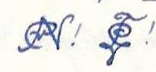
Ns! Cl!
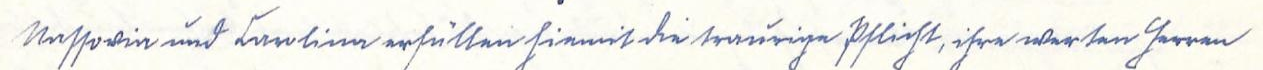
Nassowia und Carolina erfüllen hiermit die traurige Pflicht, ihre werten Herren
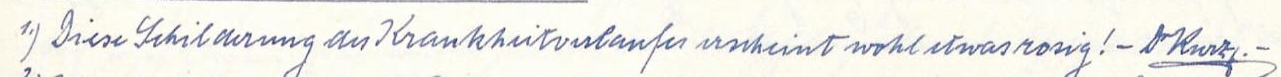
1) Diese Schilderung des Krankheitsverlaufes erscheint wohl etwas rosig! – v Kurz.
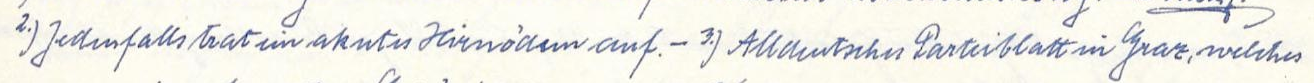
2) Jedenfalls trat ein akutes Hirnödem auf. – 3) Alldeutsches Parteiblatt in Graz, welches
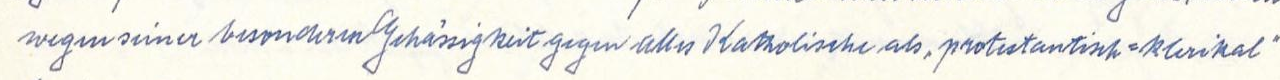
wegen seiner besonderen Gehässigkeit gegen alles Katholische als „protestantisch-klerikal“
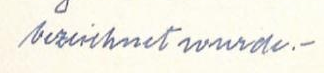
bezeichnet wurde.
